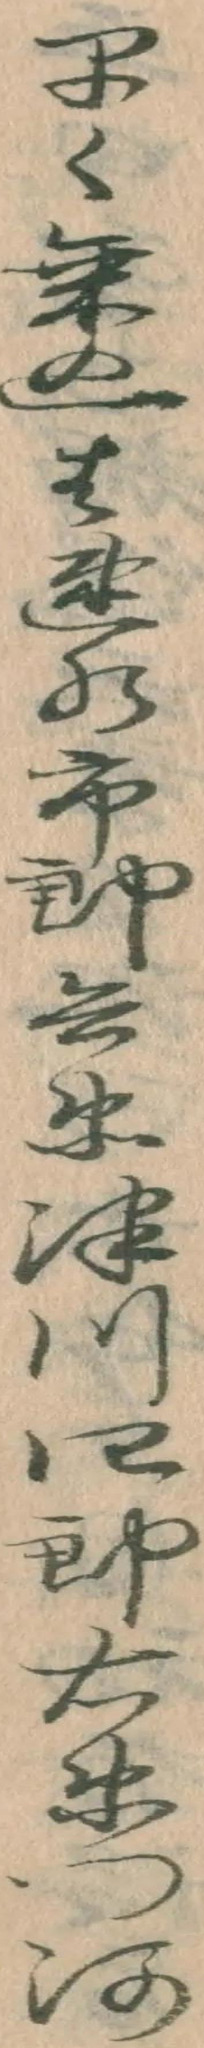早く乗込者速水市郎兵衛津川四郎右衛門河
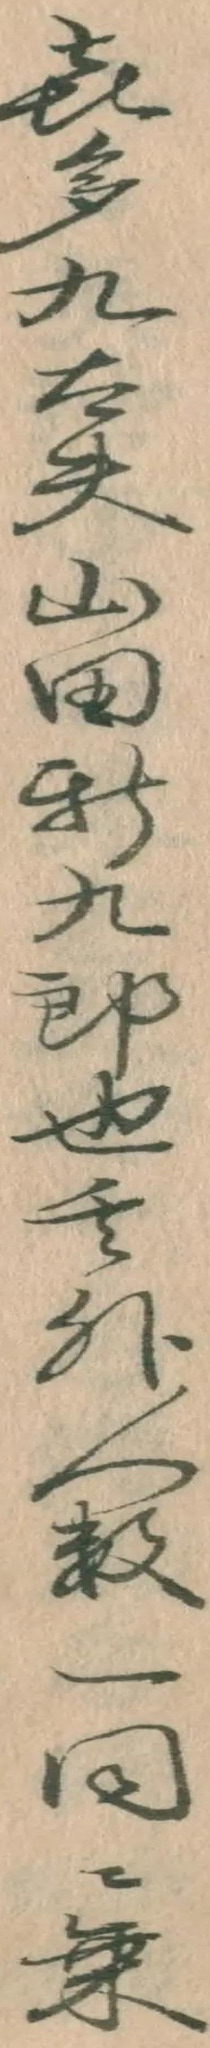喜多九太夫山田新九郎也其外人数一同に乗
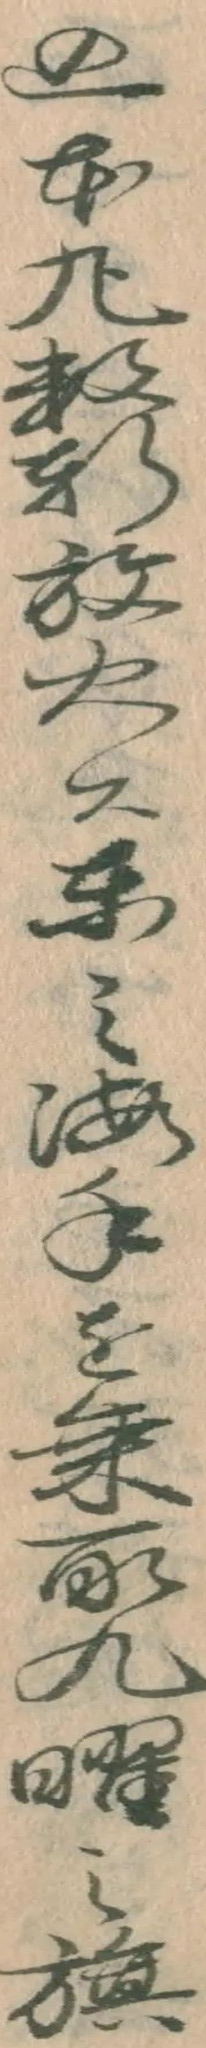込本丸数軒放火す東之海手を乗取九曜之旗
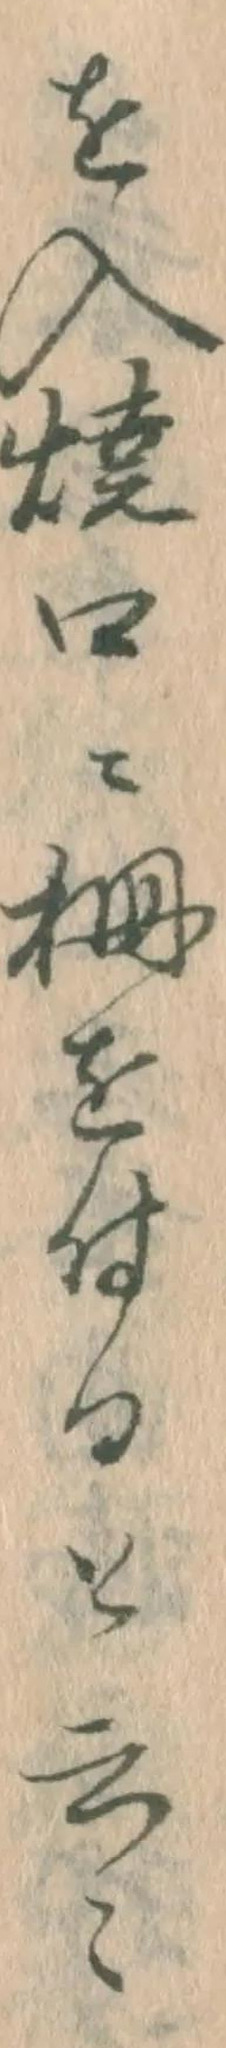を入焼口に柵を付ると云々
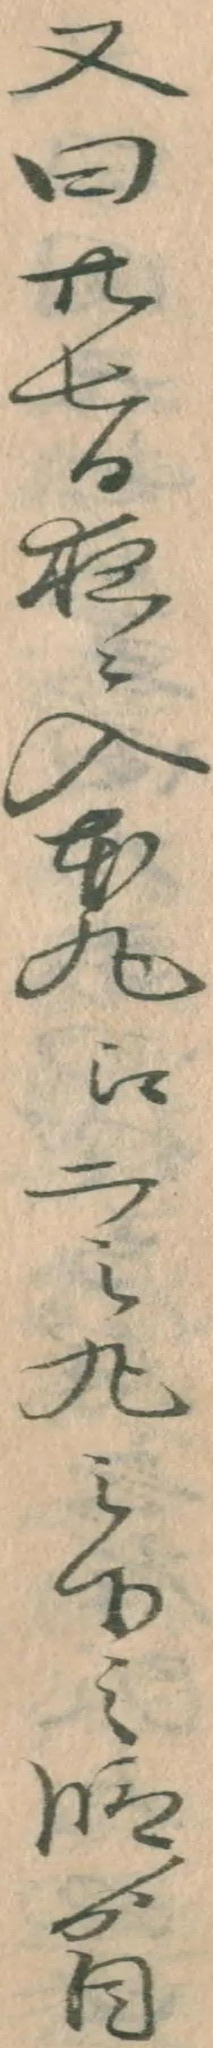又曰廿七日夜に入本丸江二之丸之下之段ゟ自
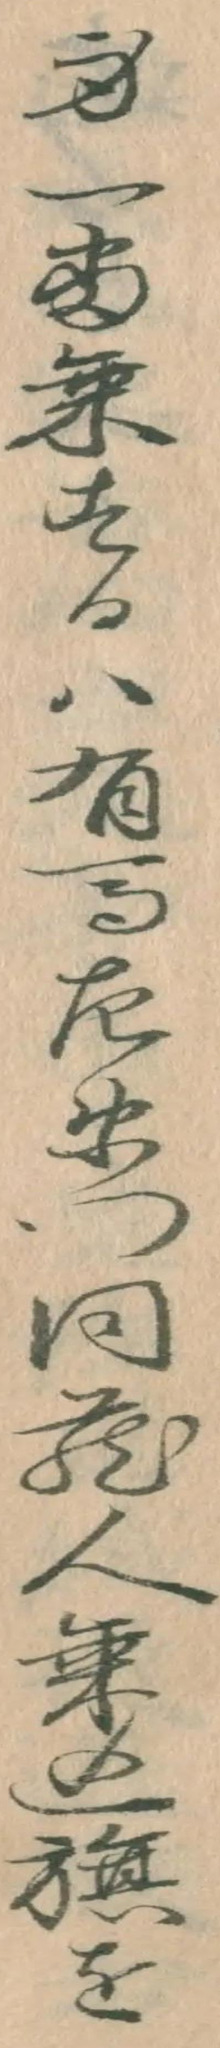身一番乗春るは有馬左衛門同蔵人乗込旗を

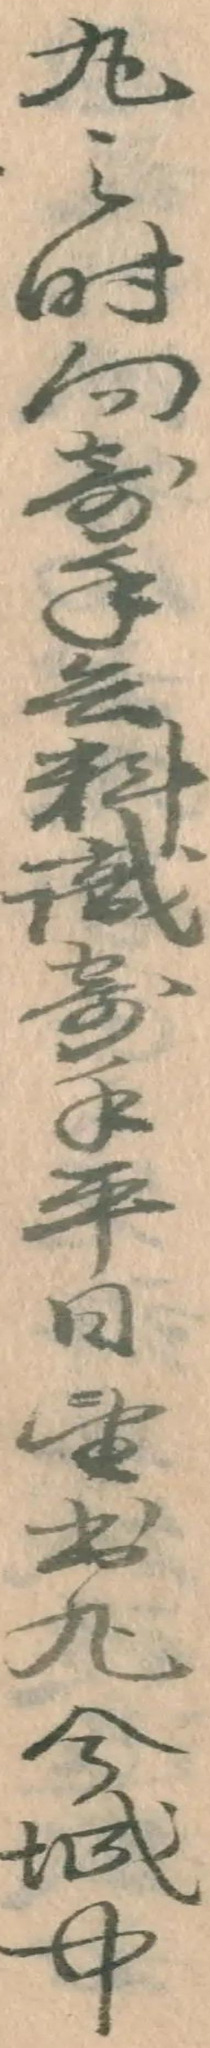丸之時向寄手兵料識寄手平日望出丸今城中
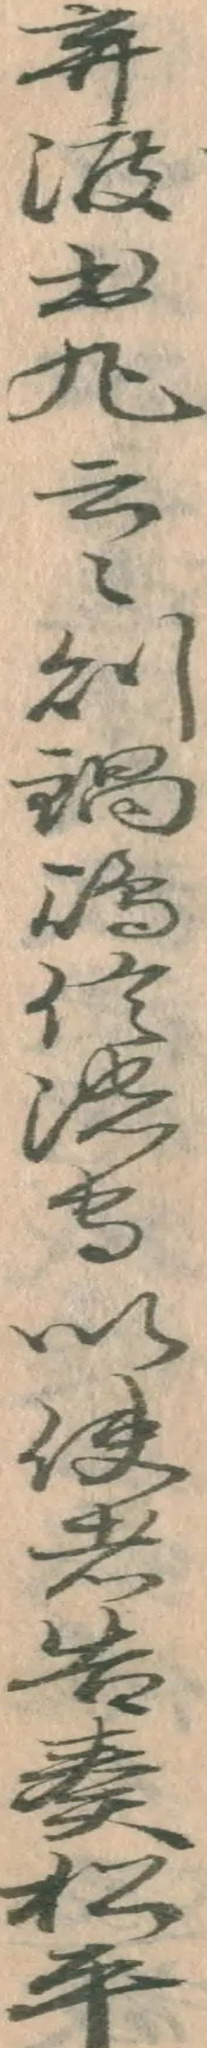弃渡出丸云々則鍋島信濃守以使者告奏松平
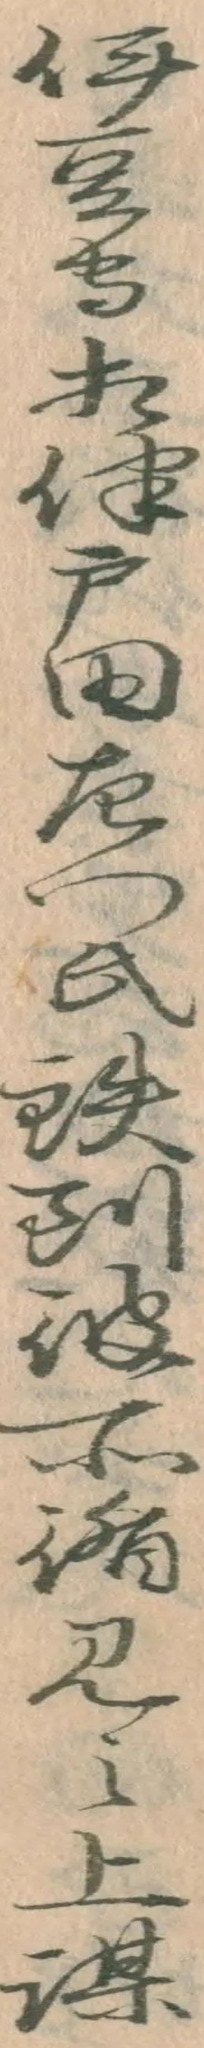伊豆守相伴戸田左門氏鉄到彼所循見之上謀
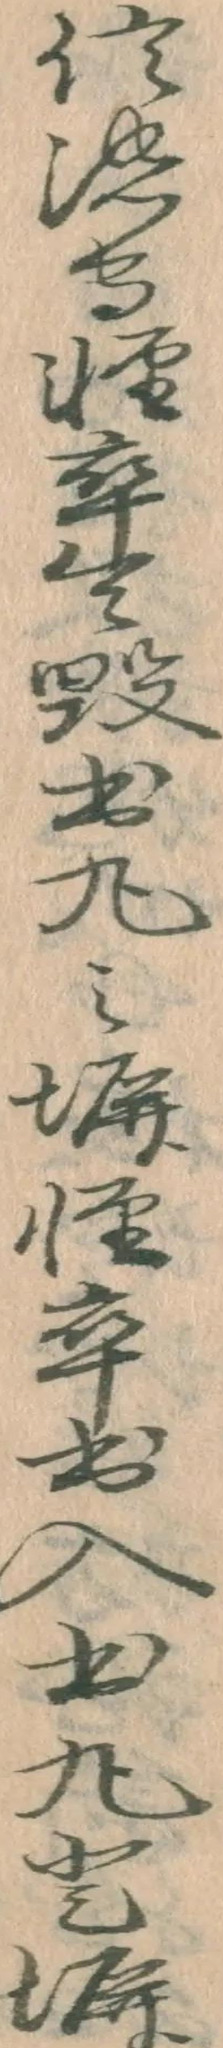信濃守軽卒令毀出丸之塀軽卒出入出丸登塀
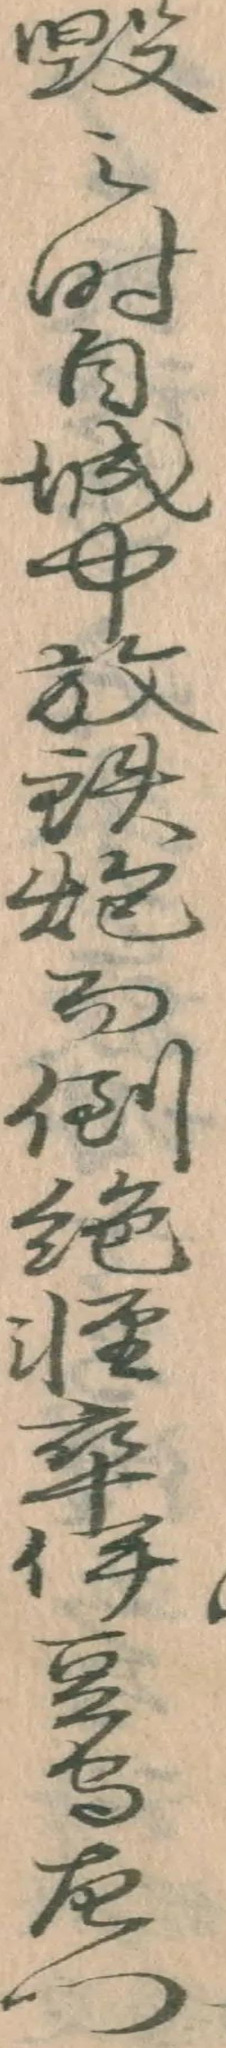毀之時自城中放鉄砲而倒絶軽卒伊豆守左門
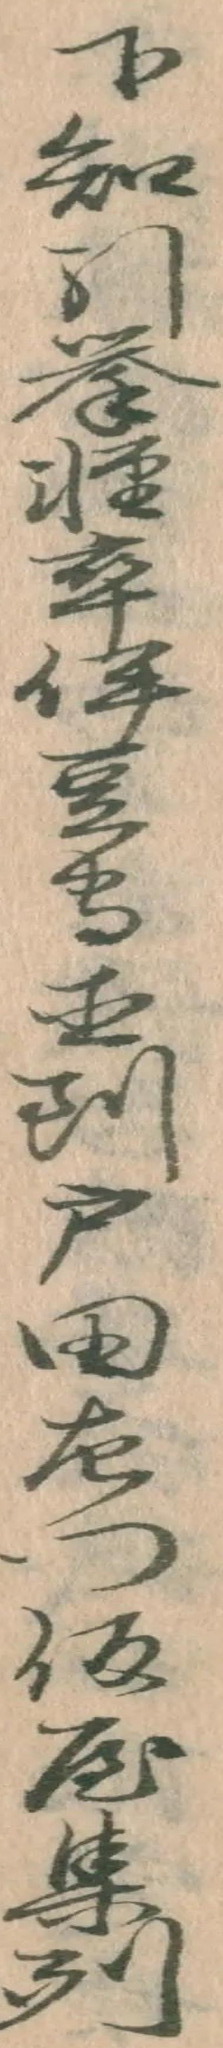下知引挙軽卒伊豆守直則戸田左門仮屋集列
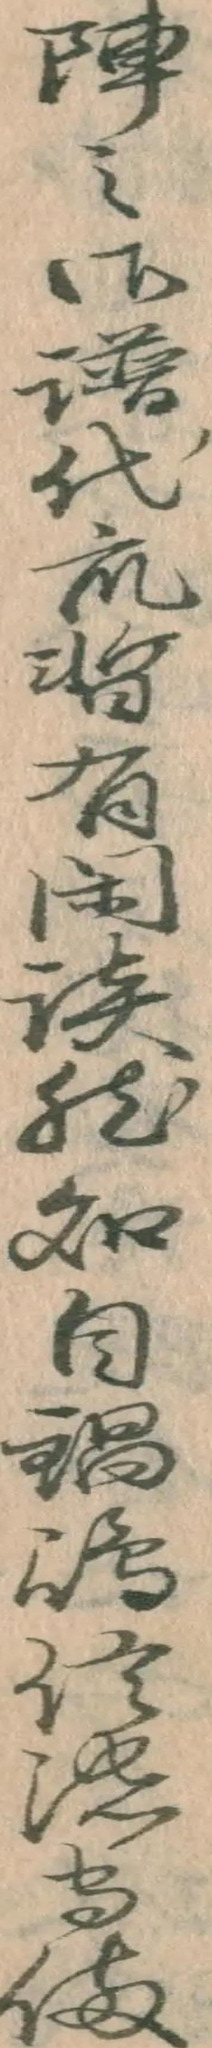陣之御譜代衆暫有閑談然処自鍋島信濃守備
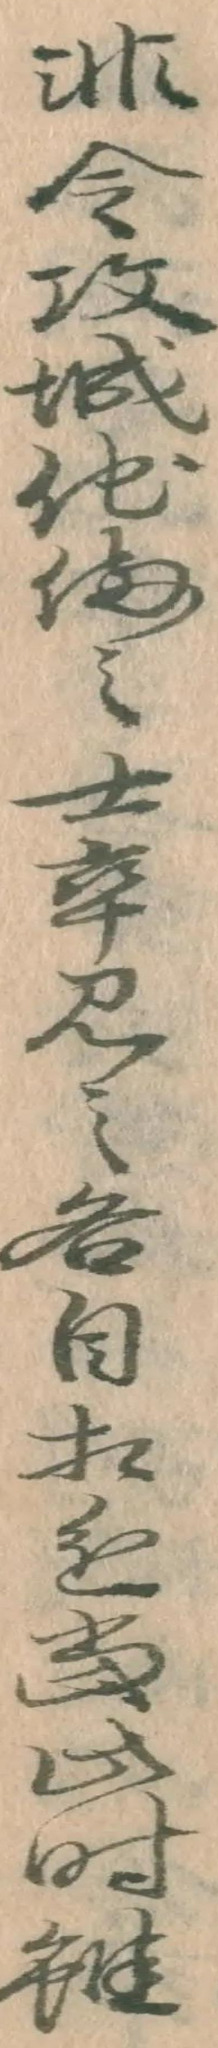非令攻城他備之士卒見之各自相進当此時雖
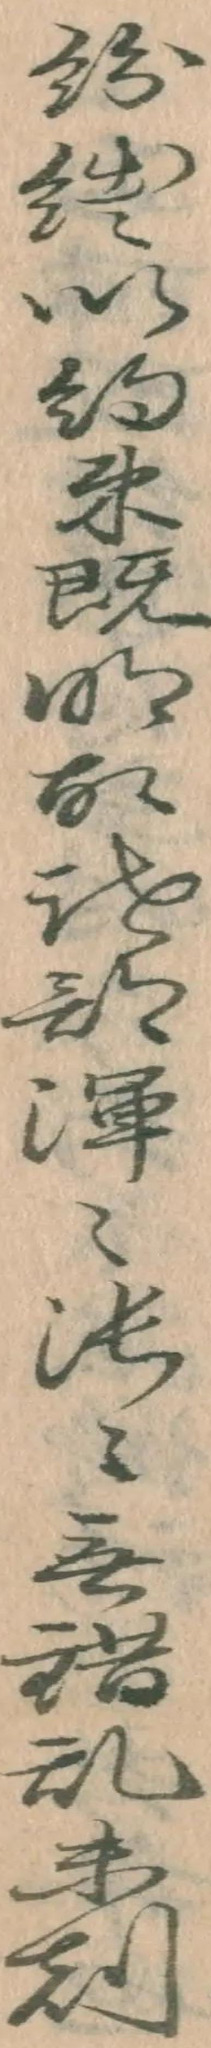紛結以約束既明故諸部渾々張々無錯乱未刻
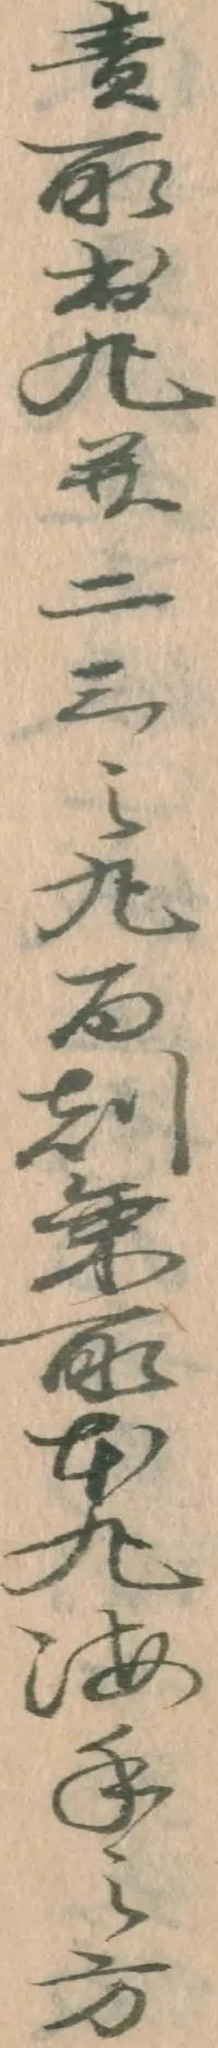責取出丸幷二三之丸酉刻乗取本丸海手之方
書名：切支丹御退治記 49巻. [8]
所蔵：国立国会図書館 National Diet Library, JAPAN
